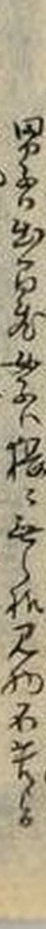男子ハ出間敷女子ハ猥ニ無之様見物不苦旨
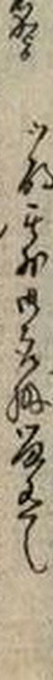御触其外御取扱留有之
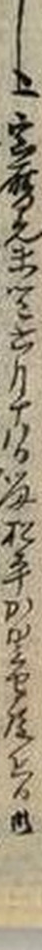・一宝暦元未閏六月十八日留松平加賀守殿近日御
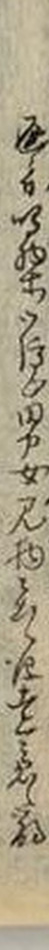通ニ付鳴物等御停止男女見物被出候儀遠慮之御触
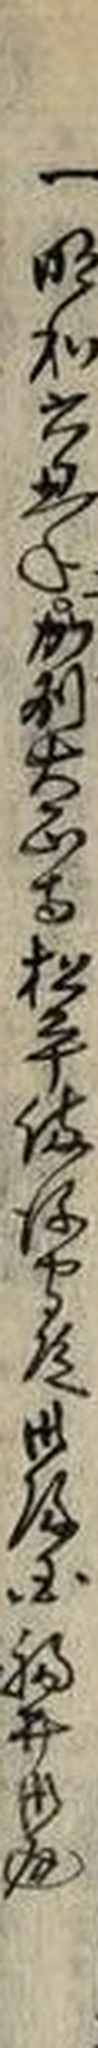一明和六丑年十一月加州大正寺松平備後守殿御帰国福井御通
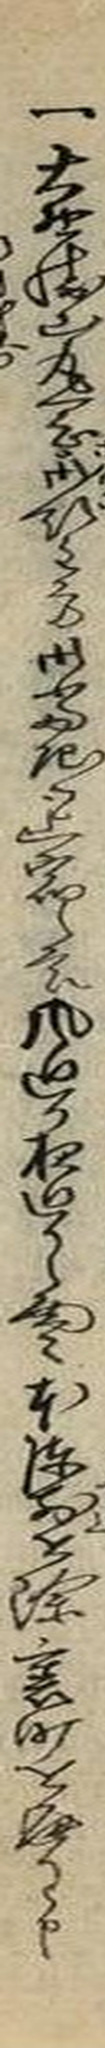一大野勝山丸岡等他所御領主方御当地御止宿之節風廻り夜廻り之面々本陣前を除裏町を通り被申
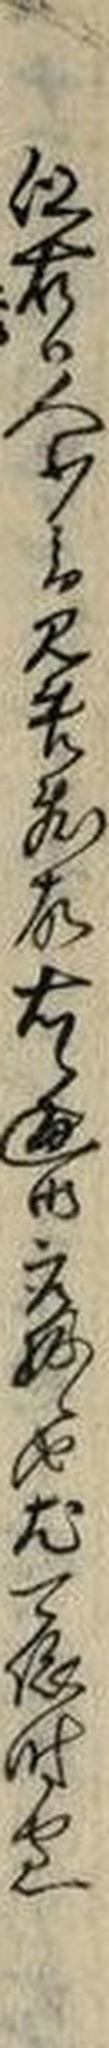但右ハ人少ニ而見苦敷故右之通御取扱候由尤可依時宜
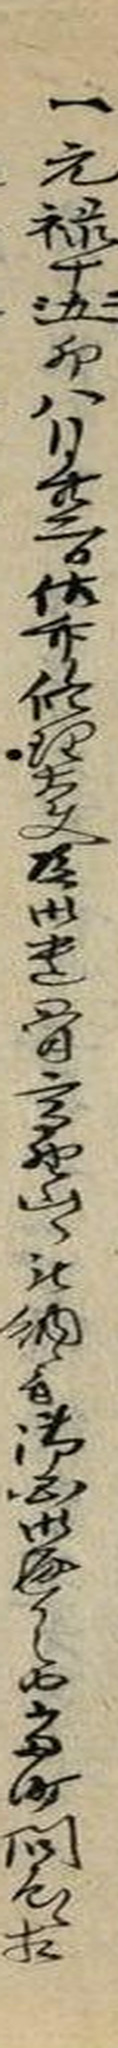一元禄十五二卯八月廿二日佐竹修理太夫殿御遺骨高野山へ被納候ニ付諸国御通り之由当町問屋へ相
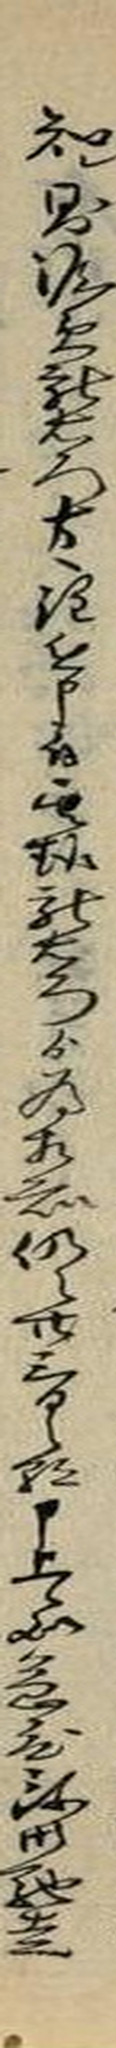知レ則渥美新右衛門方へ注進申ニ付其趣新右衛門ゟ為相知仍之廿三日之朝申上候処急度致御馳走
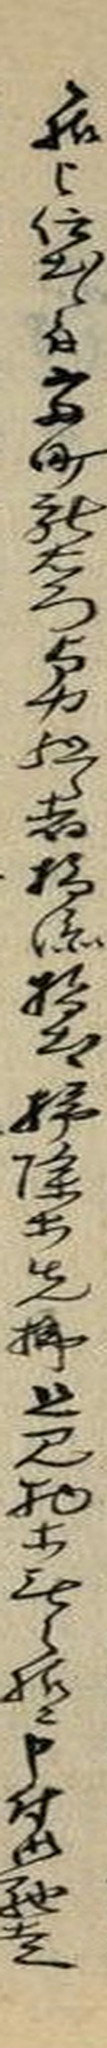候様被仰出候ニ付当町新右衛門与力組之者指添指出候掃除等先払且見物等無之様ニ申付御馳走
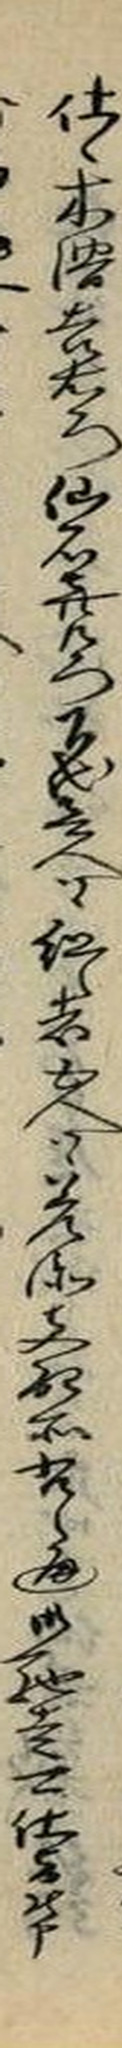仕候木滑吉左衛門仙石喜左衛門下代壱人ツヽ組之者五人ツヽ差添支配所右之通御馳走可仕旨被申
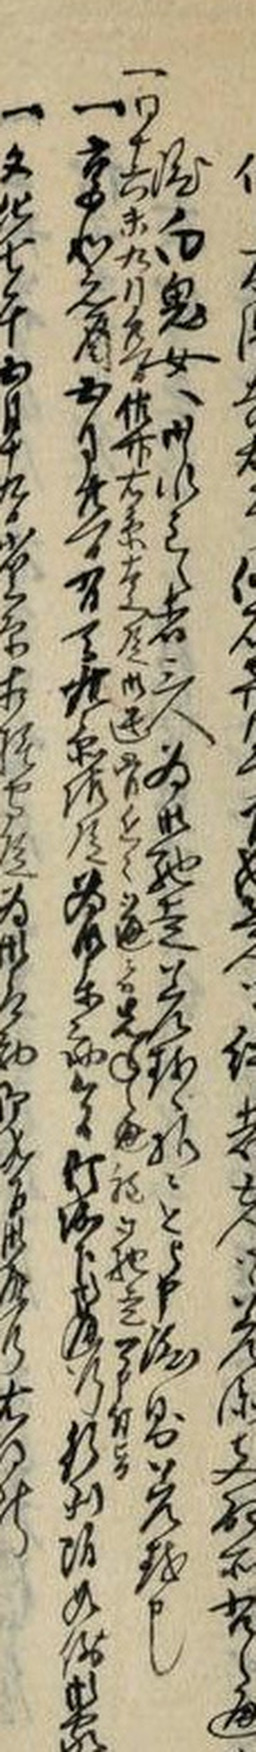一同十六未九月廿一日佐竹右京大夫殿御遺骨近々御通ニ付先年之通程御馳走可申付旨
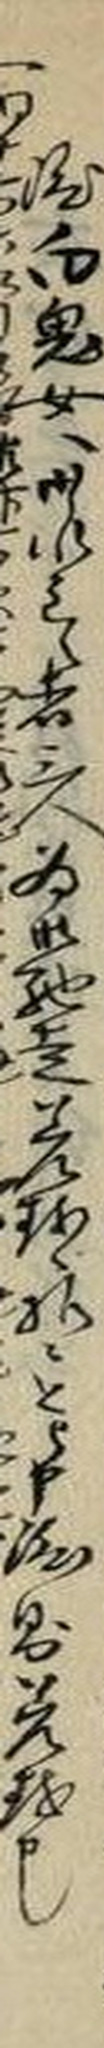渡白鬼女へ御水主之者三人為御馳走差越候様ニと被申渡則差越申候
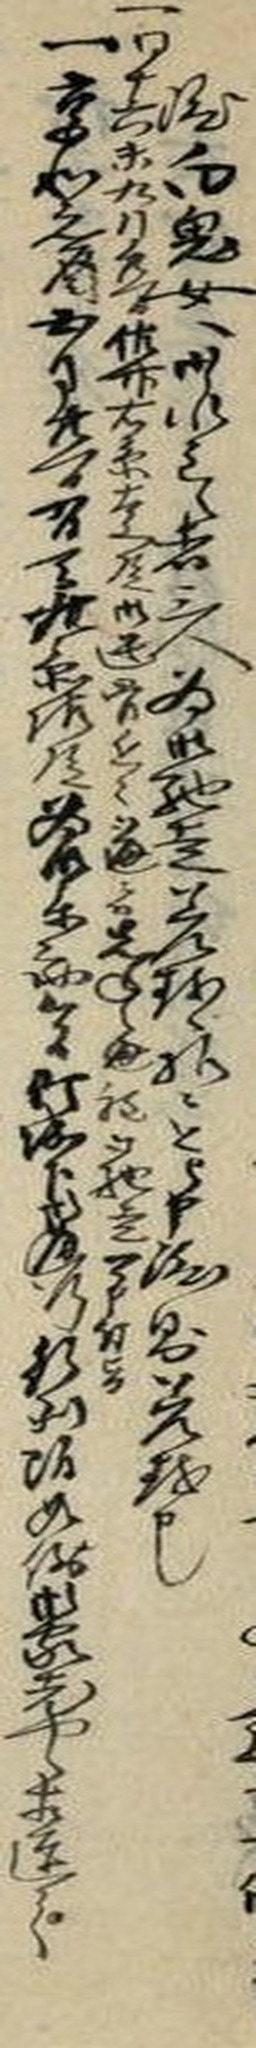一享和元酉五月廿一日有馬左兵衛佐殿為御参勤今日御城下御通行行列附如例御家老中へ相達候之候
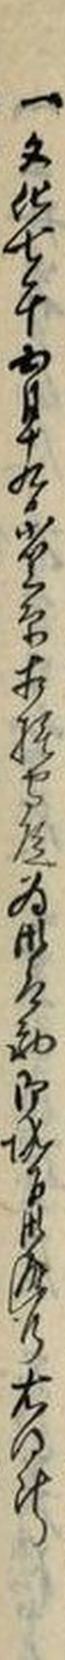一文化七午五月十九日小笠原相模守殿為御参勤御城下御通行右同断
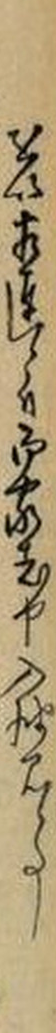を以相達候ニ付御家老中入披見候事
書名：御国他国諸事之部
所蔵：福井県文書館 Fukui Prefectural Archives
